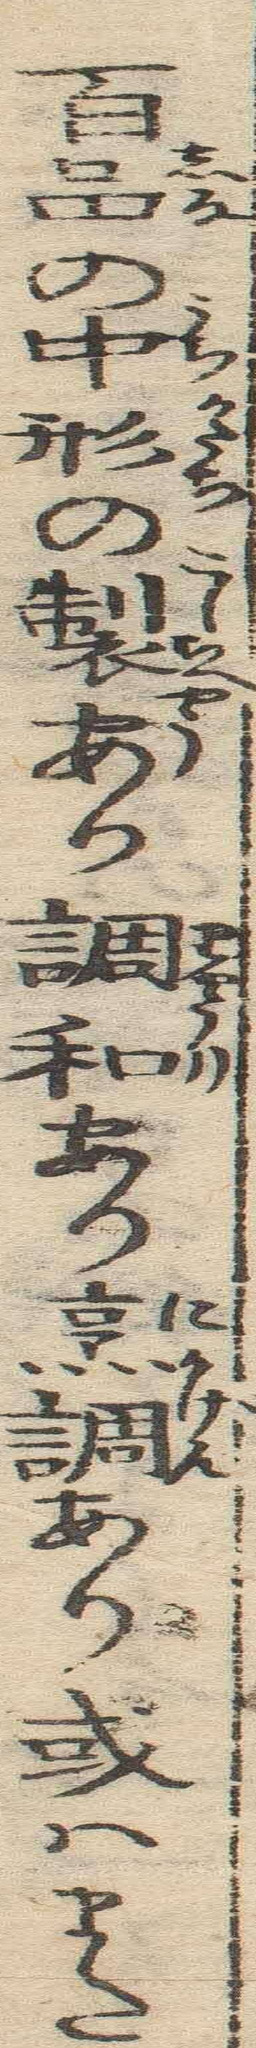一百品の中形の製あり調和あり烹調あり或はまた

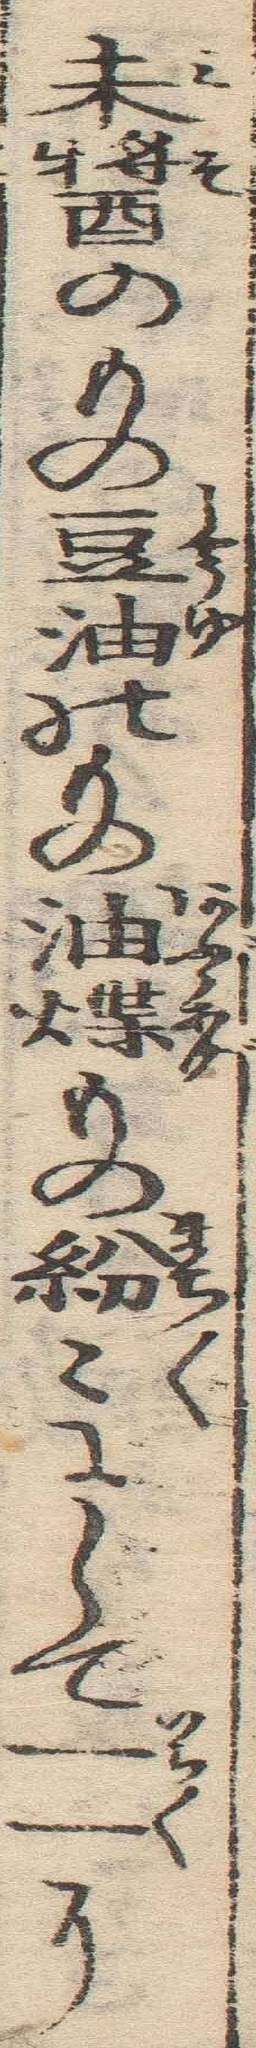未醤のもの豆油のもの油煠もの紛々にして一一に
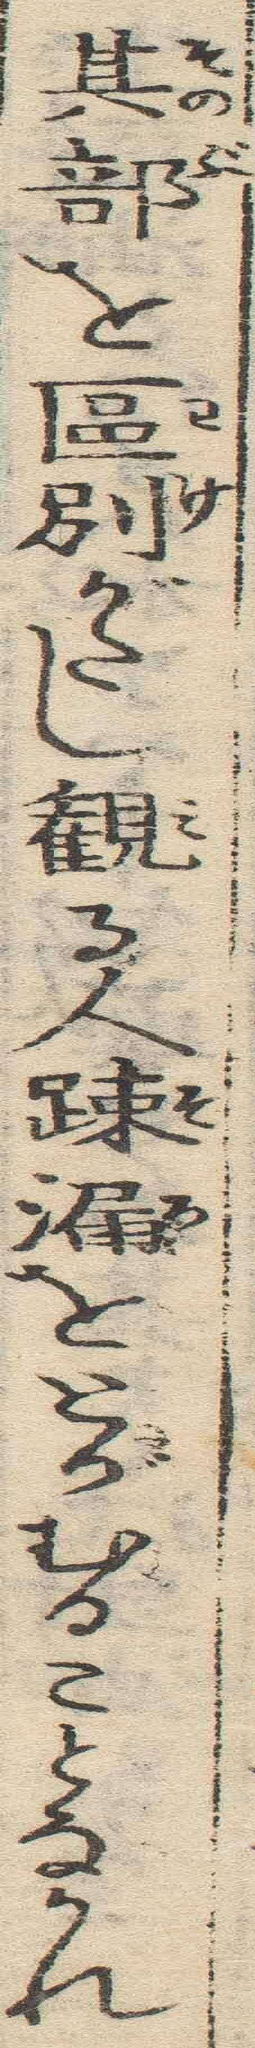其部を区別がたし観る人疎漏をとがむることなかれ
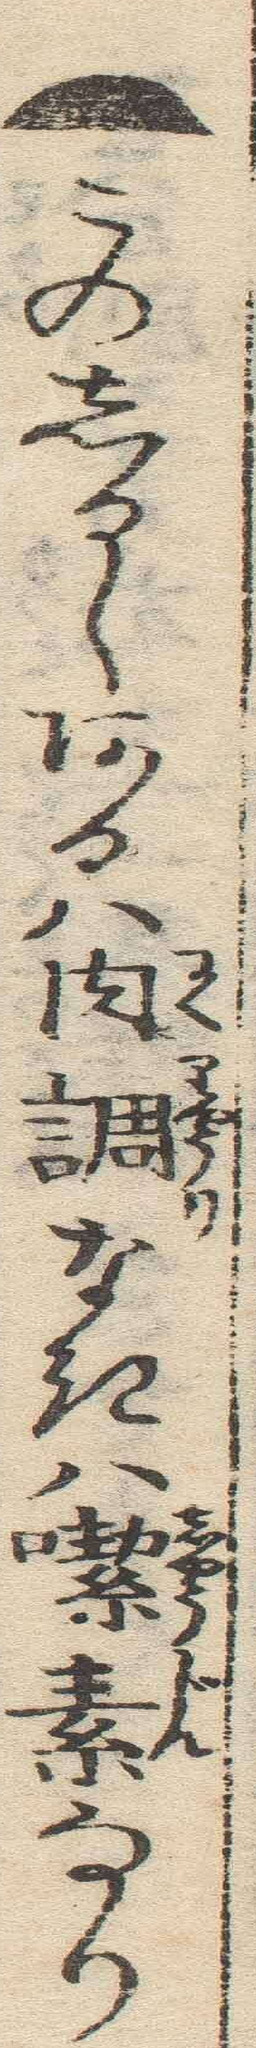一◓このしるしあるは肉調なきは噄素なり
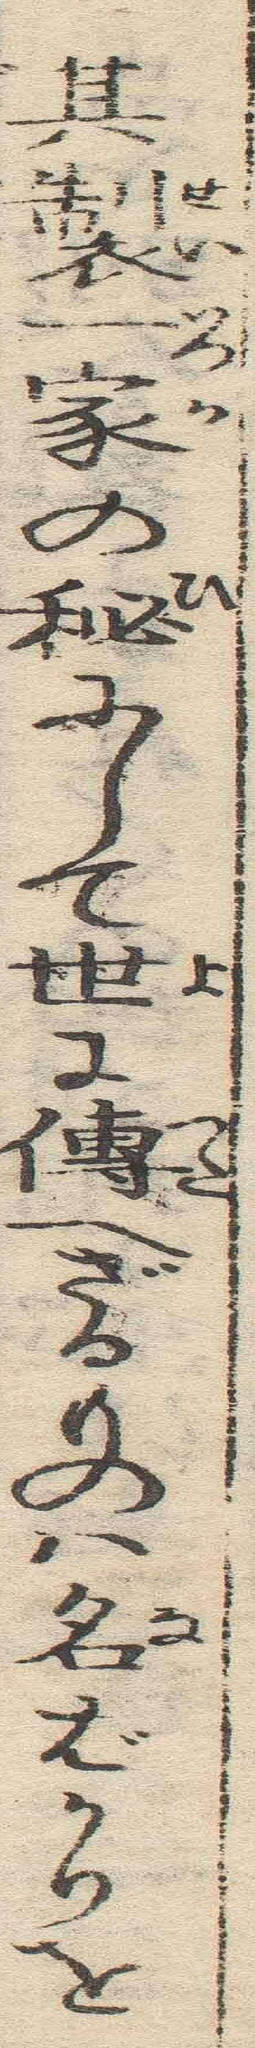一其製一家の秘にして世に伝へざるものは名ばかりを
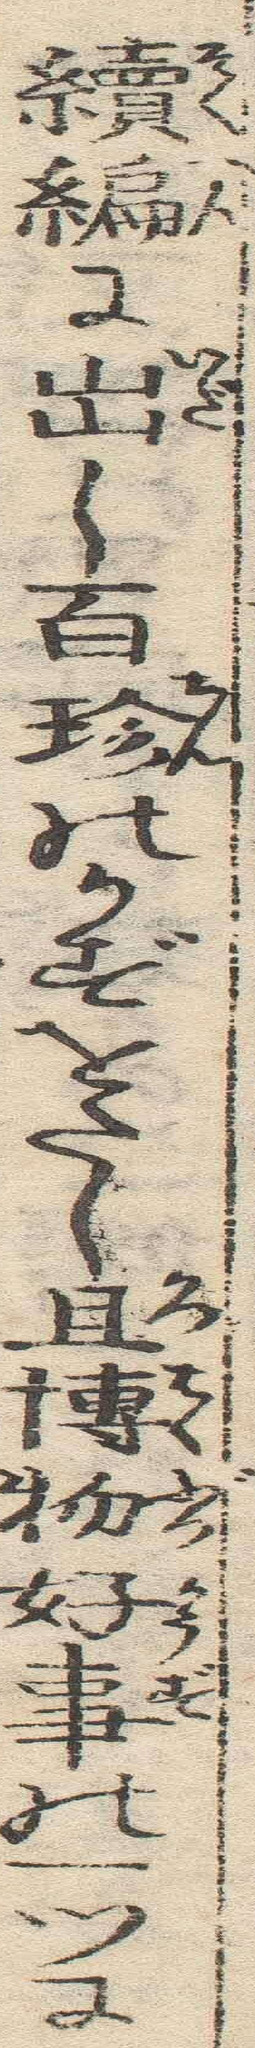続編に出し百珍のかずをたし且博物好事の一ツに
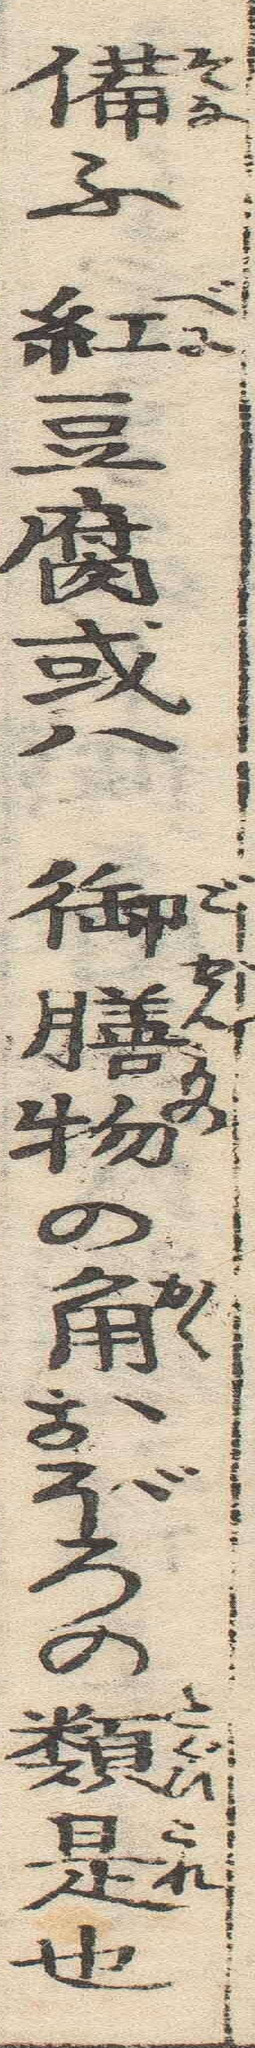備ふ紅豆腐或は御膳物の角おぼろの類是也
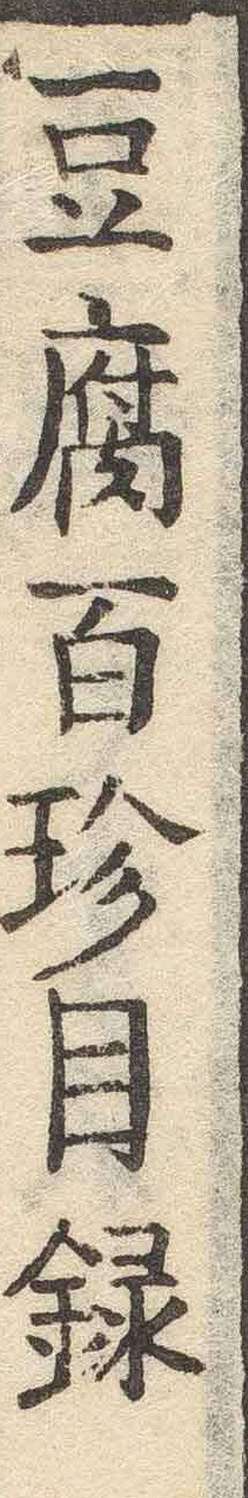豆腐百珍目録
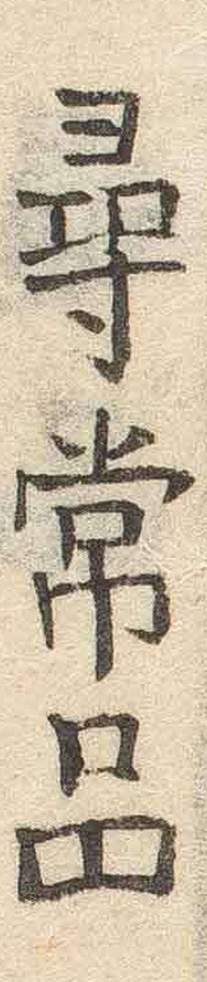尋常品

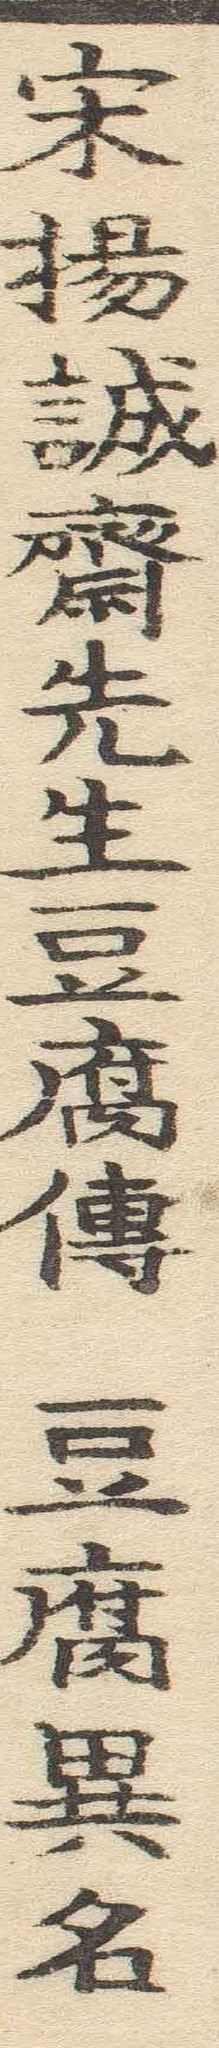宋楊誠齋先生豆腐伝豆腐異名

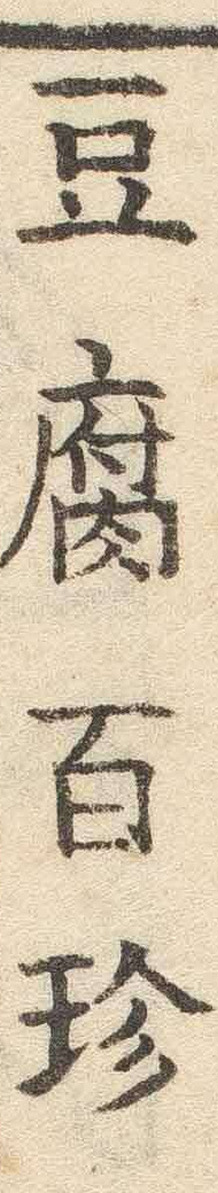豆腐百珍
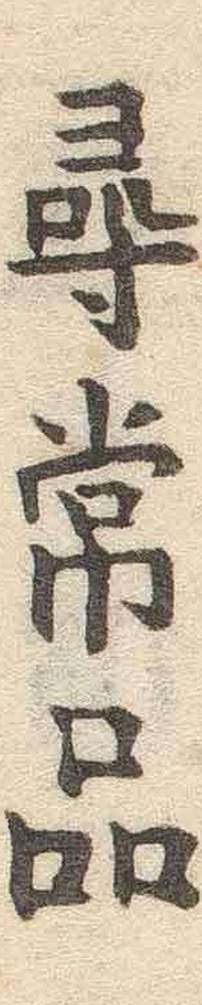尋常品
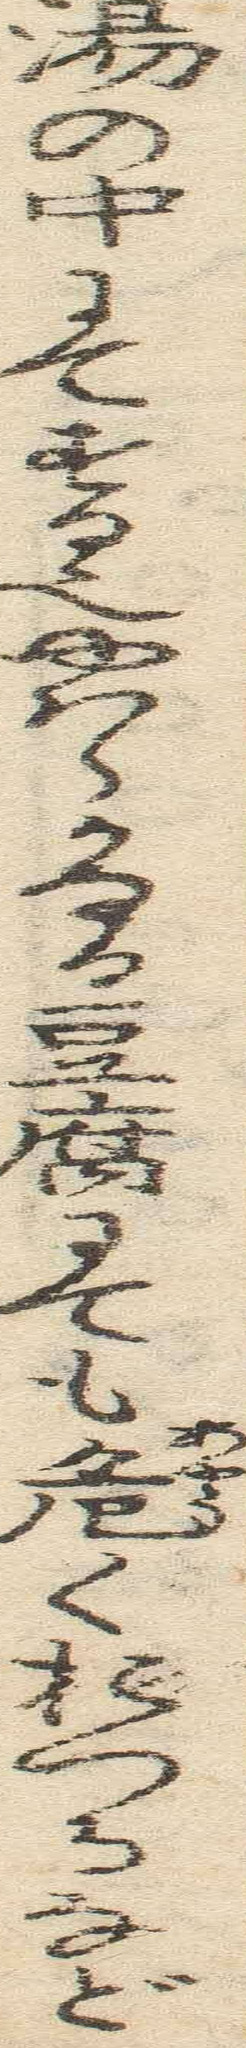湯の中にてする也やはらかなる豆腐にても危くおつるなど
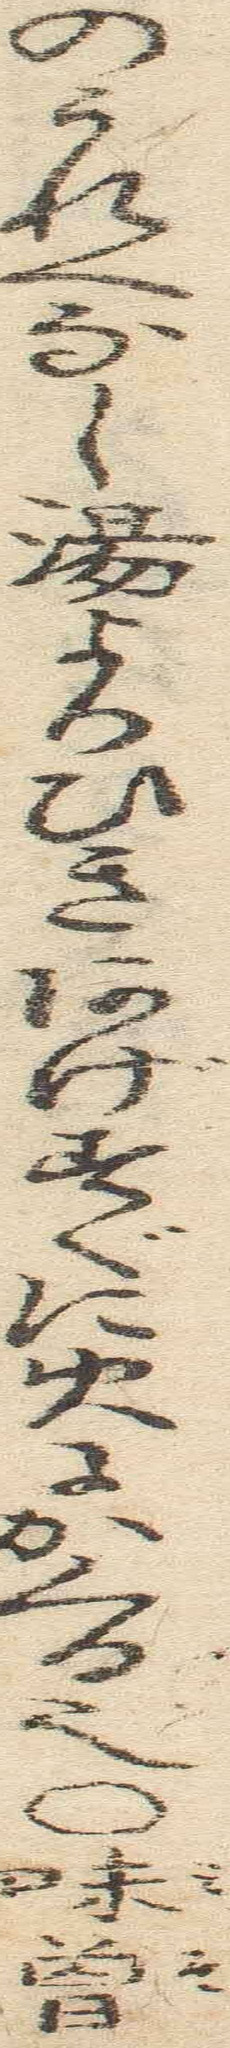のうれへなし湯よりひきあげすぐに火にかくる也○味曽
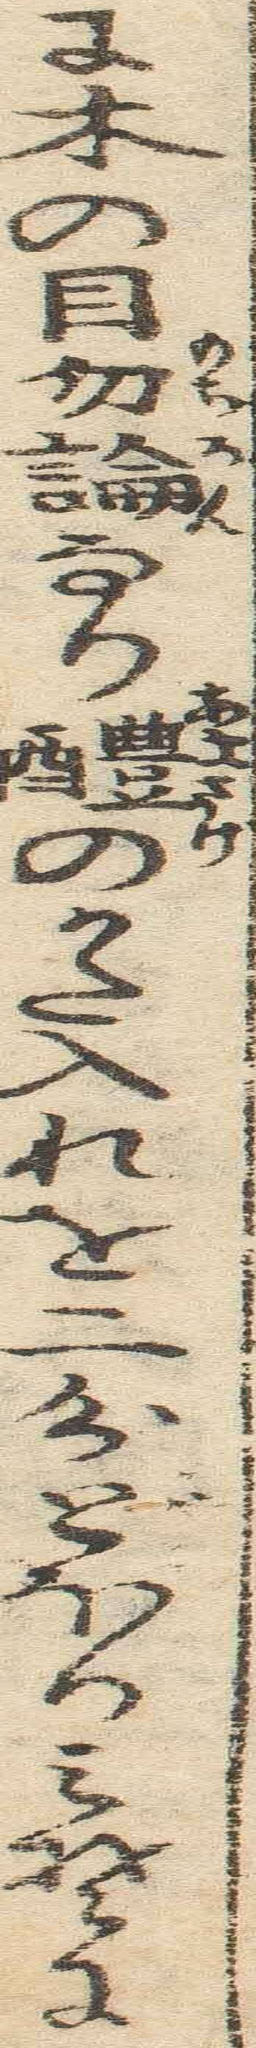に木の目勿論なり醴のかた入れを二分どほりみそに
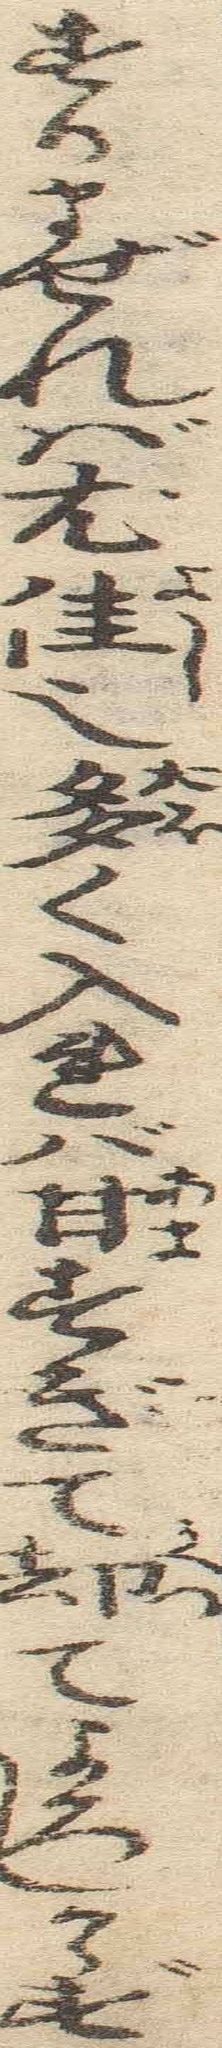すりまぜれば尤佳也多く入れば甘すぎて却てよろしからず
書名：豆腐百珍
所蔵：東京学芸大学附属図書館 国文学研究資料館
